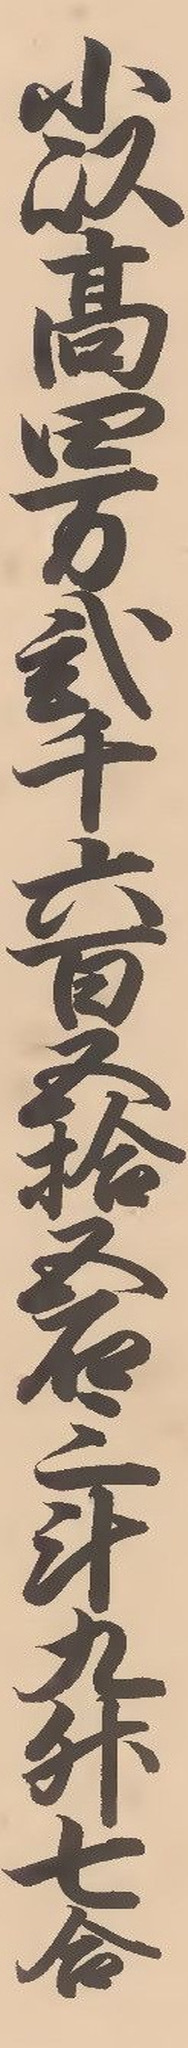小以高四万弐千六百五拾五石三斗九升七合
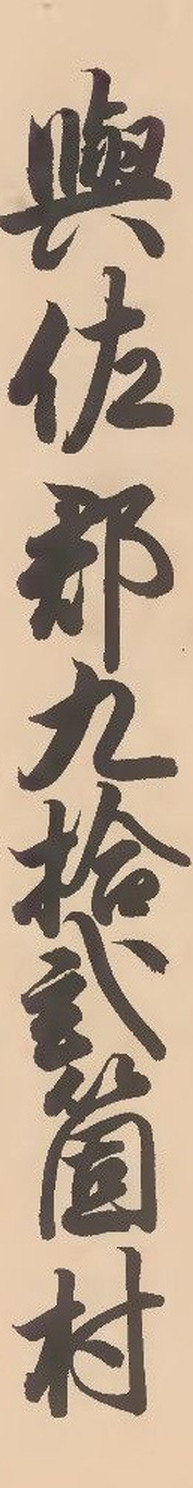与謝郡九拾弐箇村
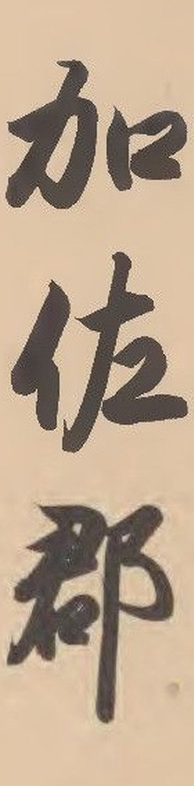加佐郡
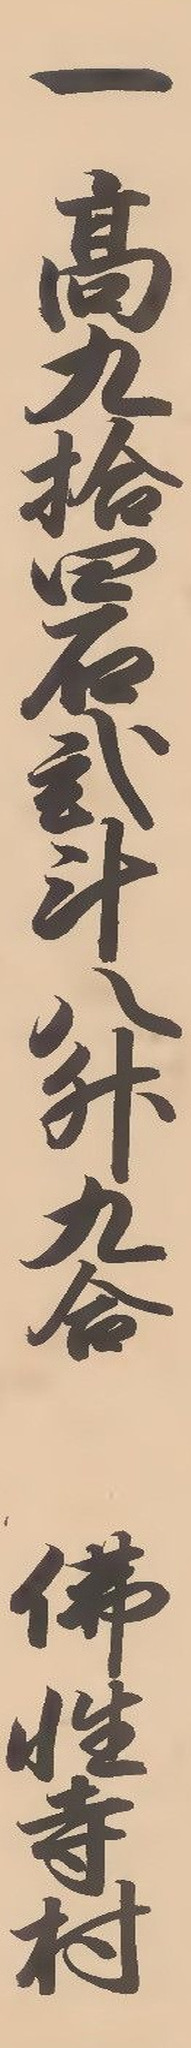一高九拾四石弐斗八升九合仏性寺村
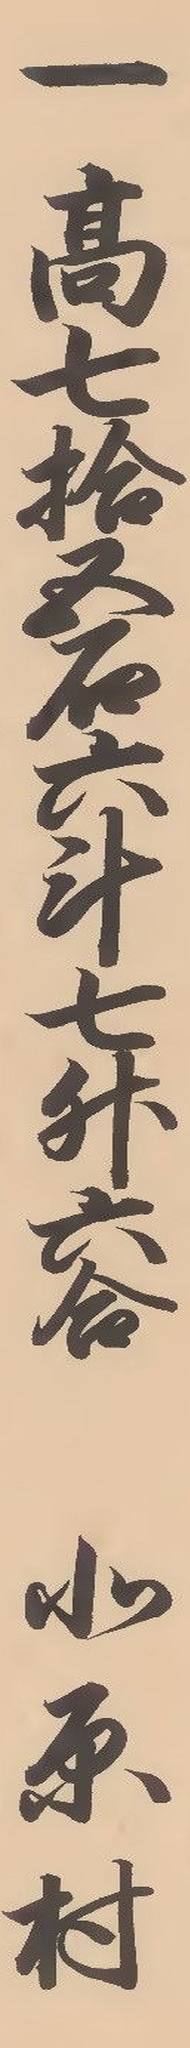一高七拾五石六斗七升六合北原村
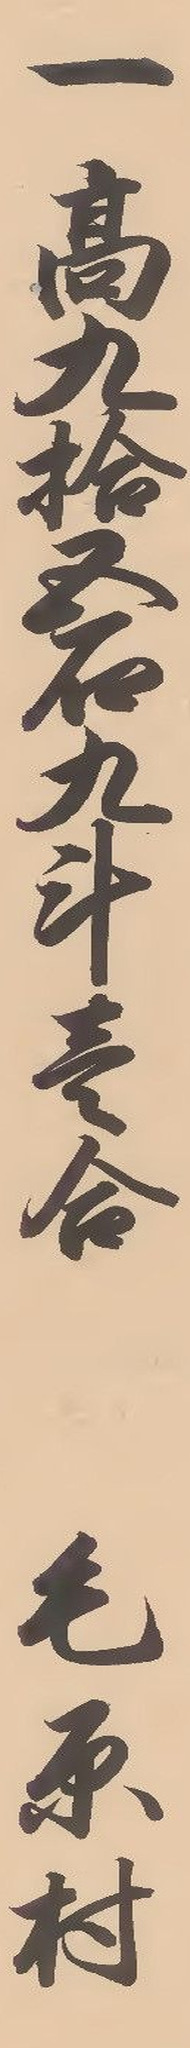一高九拾五石九斗壱合毛原村

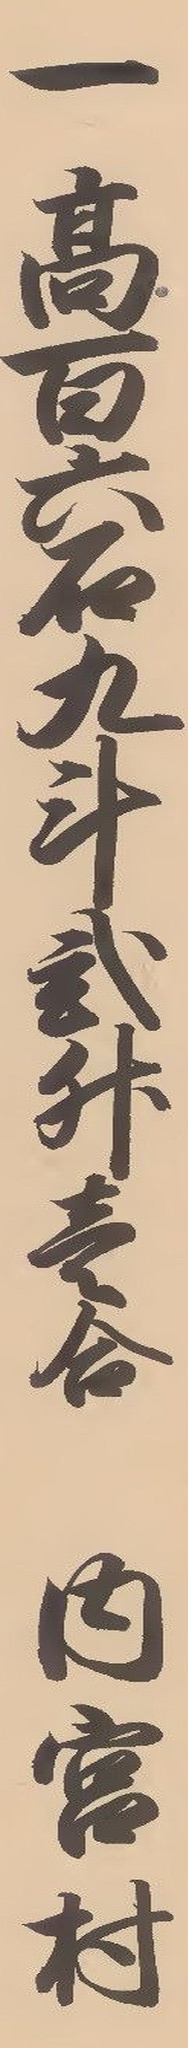一高百六石九斗弐升壱合内宮村
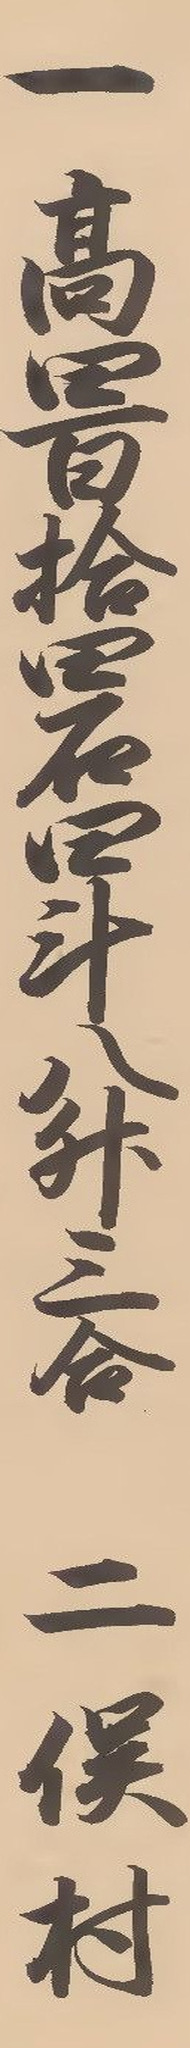一高四百拾四石四斗八升三合二俣村
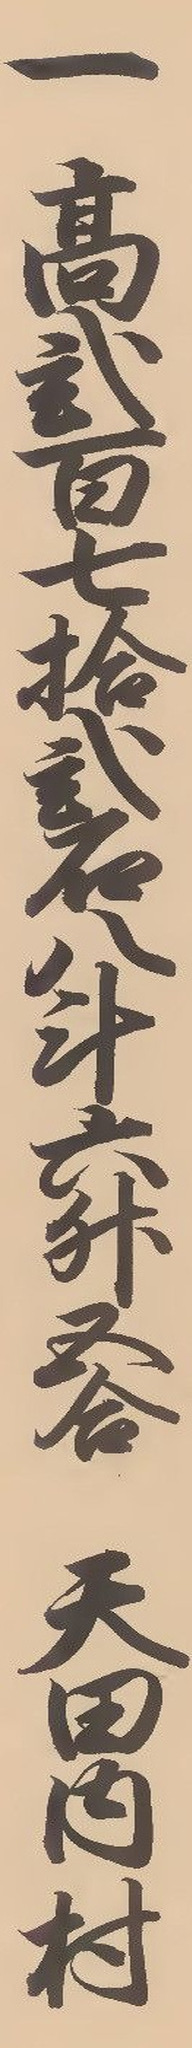一高弐百七拾弐石八斗六升五合天田内村
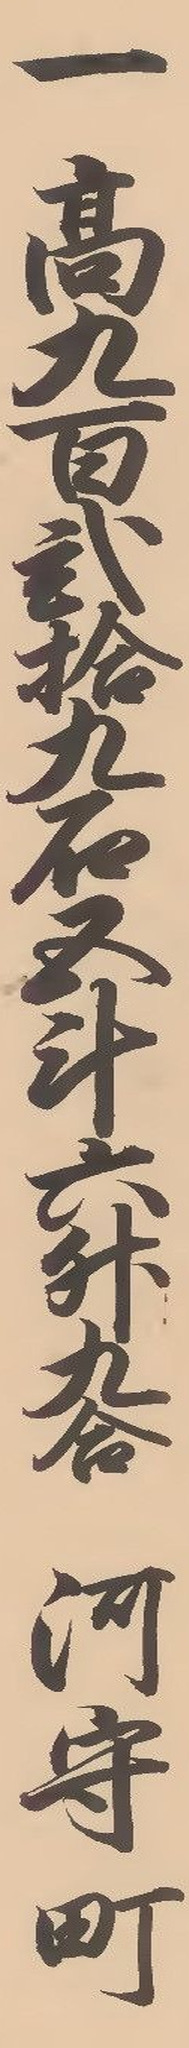一高九百弐拾九石五斗六升九合河守町
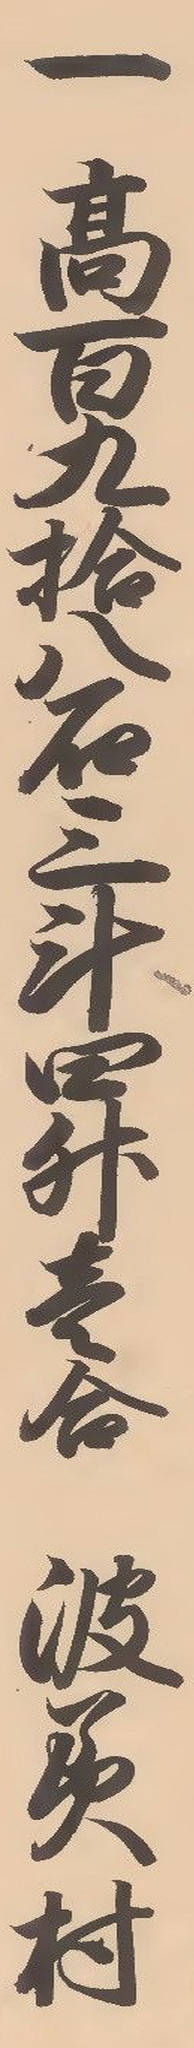一高百九拾八石三斗四升壱合波美村
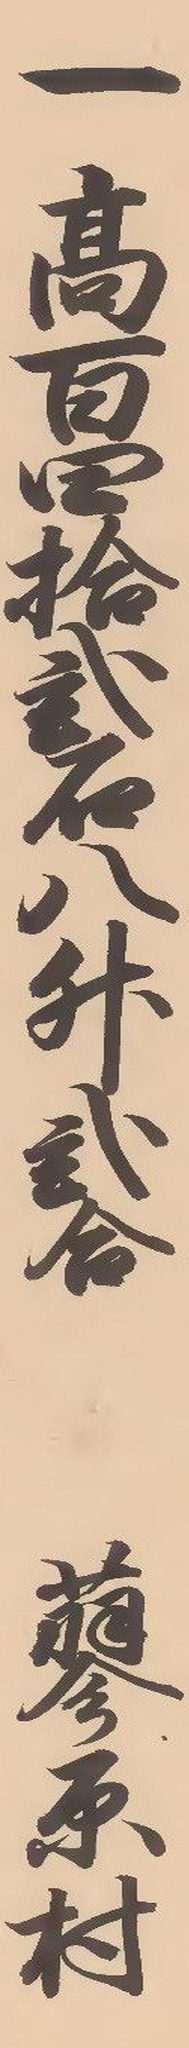一高百四拾弐石八升弐合蓼原村
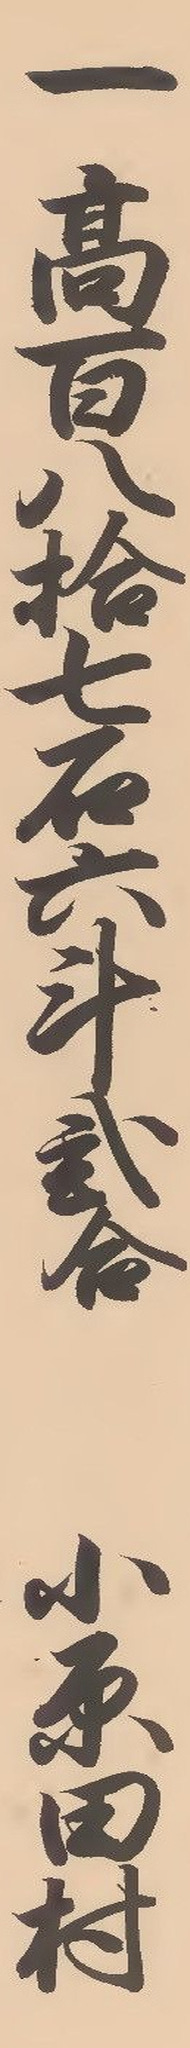一高百八拾七石六斗弐合小原田村
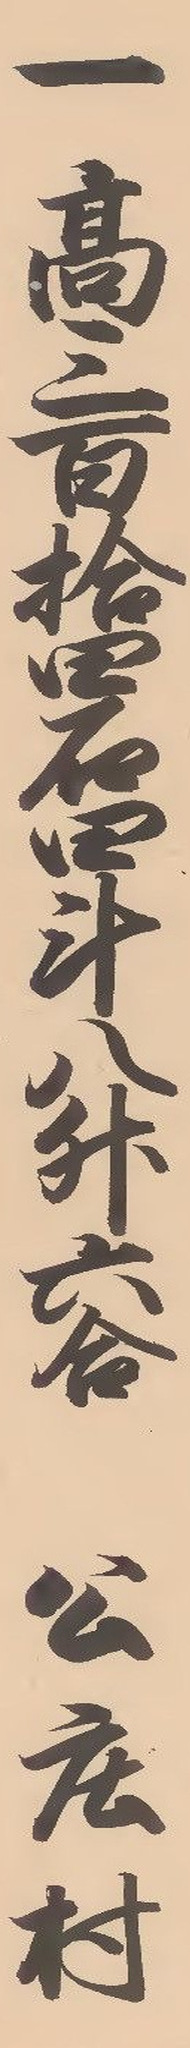一高三百拾四石四斗八升六合公庄村

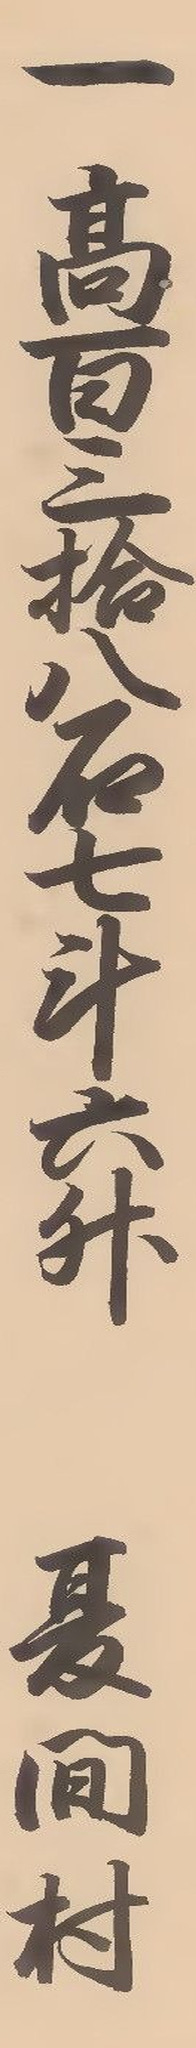一高百三拾八石七斗六升夏間村
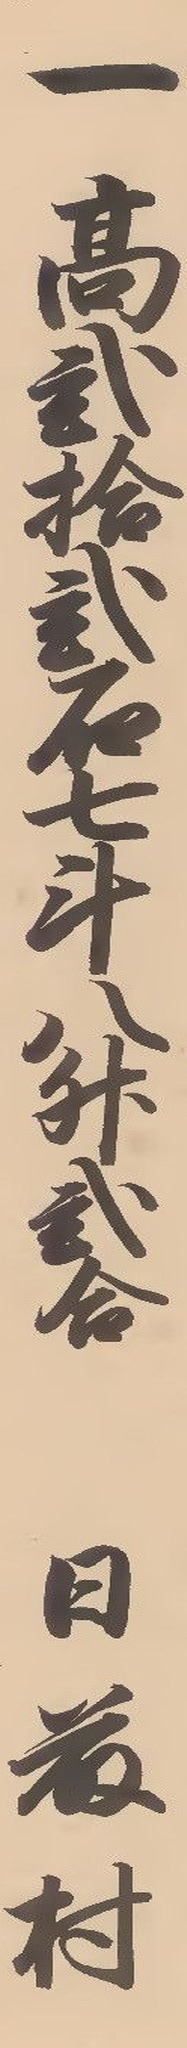一高弐拾弐石七斗八升弐合日藤村
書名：丹後国郷帳
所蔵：国立公文書館 National Archives of Japan
